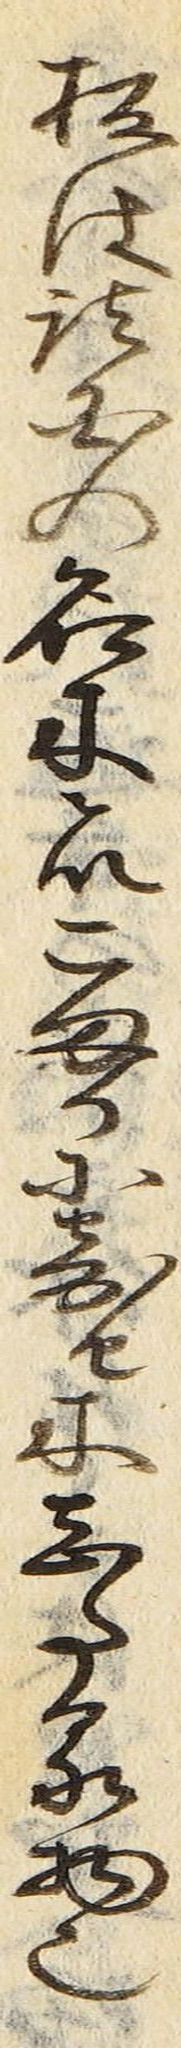板は諸国の名木を以こまかに寄せ木したる物也
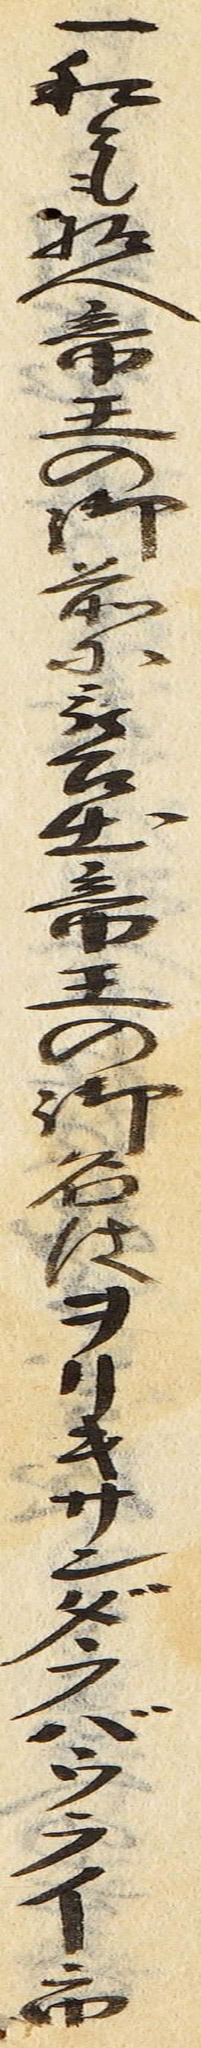一私とも拾人帝王の御前に被召出帝王の恩名はヲリキサンダラバウライ市
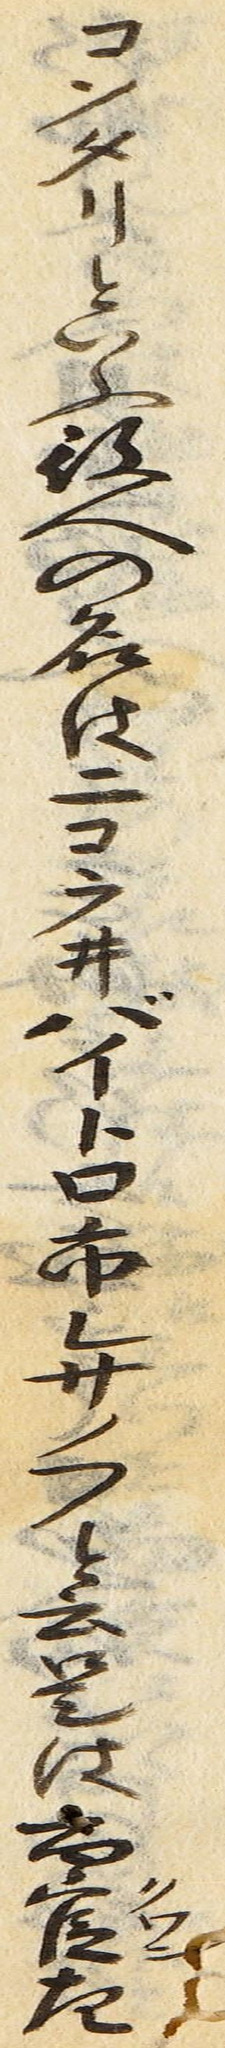コンタリといふ役人の名はニコラ井バイトロ市レサノフと云是は百官左
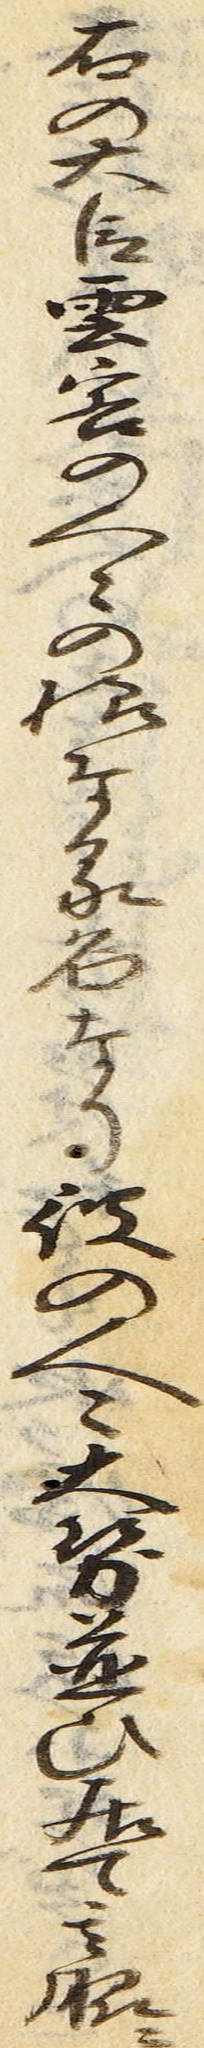右の大臣雲客の人々様なる名なり彼の人々大勢並ひ居て其脇に
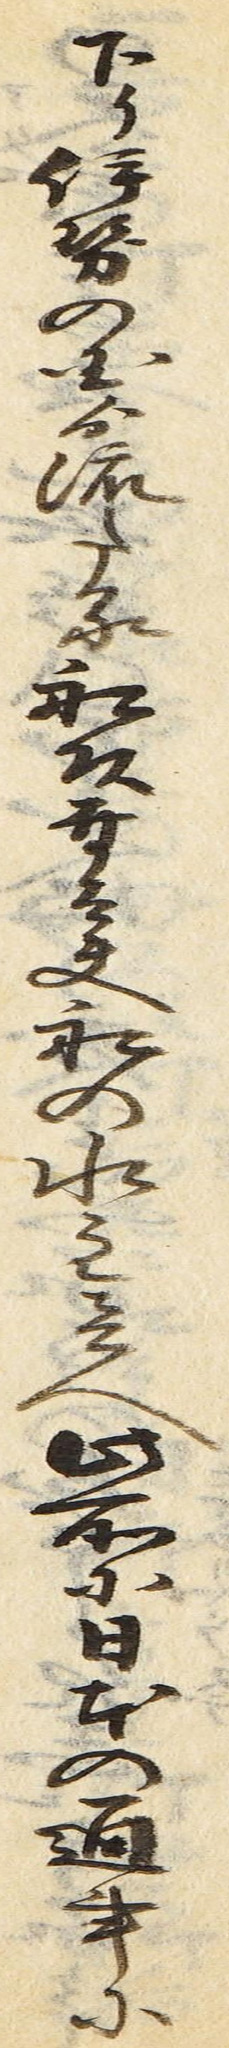下り伊勢の国ゟ流たる船頭喜太夫船の水主壱人此所に日本の通事に
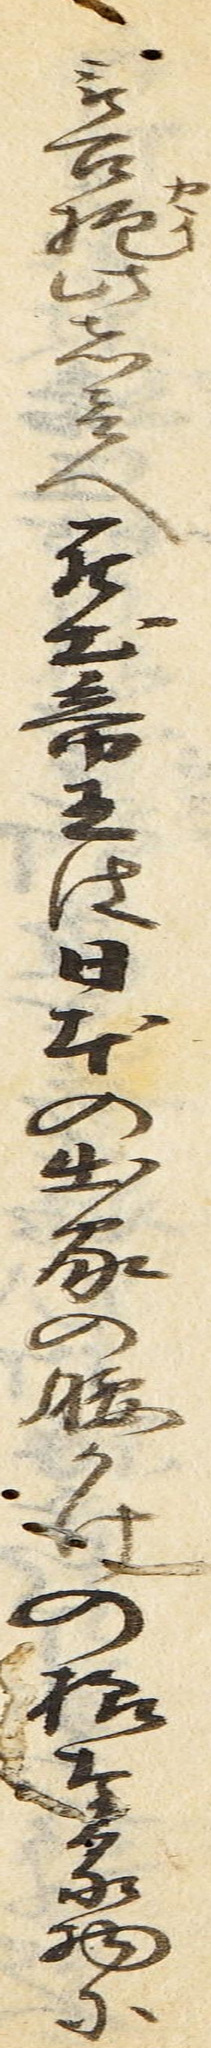被召抱此者壱人罷出帝王は日本の出家の腰かけの様なる物に
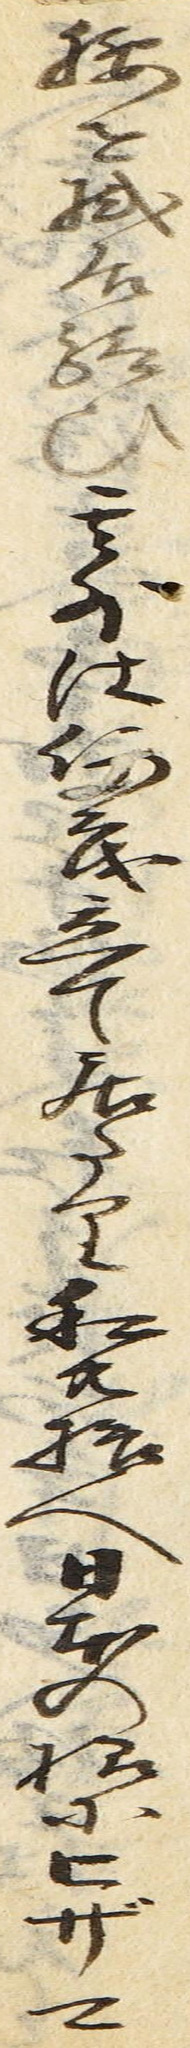腰を掛居給ひ其外は何も立て居たり私共拾人日本の様にヒザマ
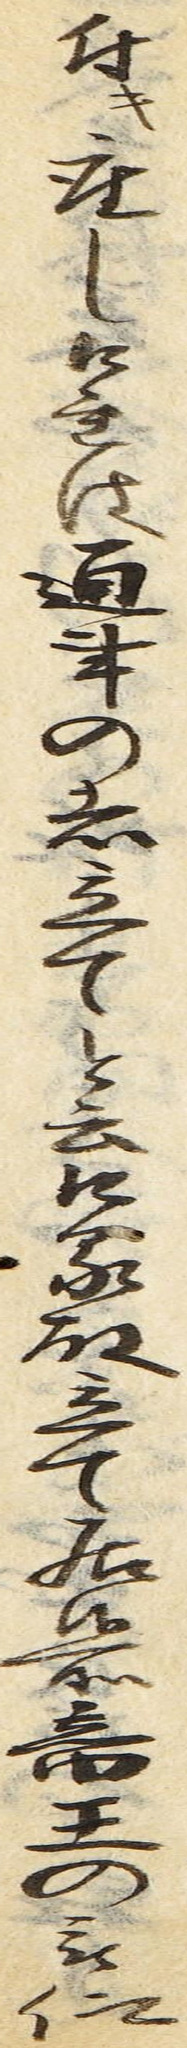付き座しけれは通事の者立てと云ける故立て居候所帝王の被仰
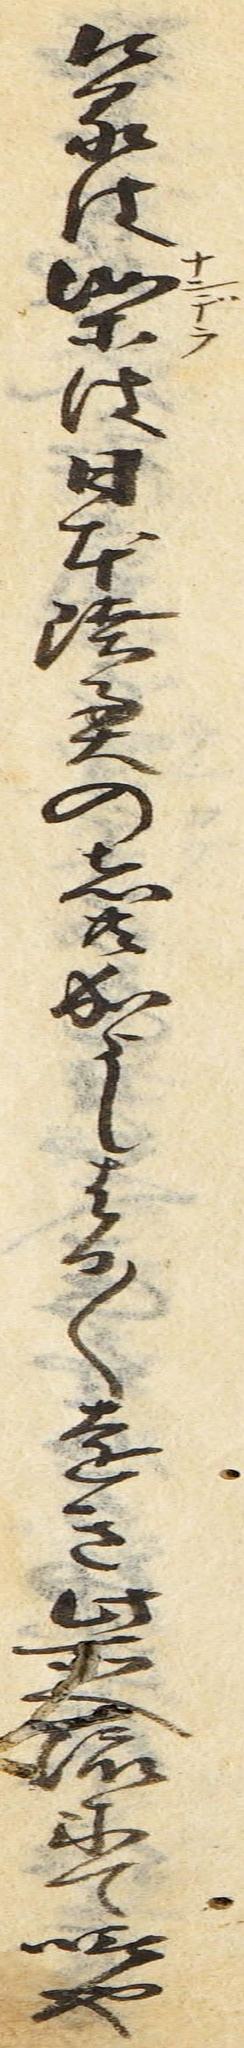けるは汝等は日本陸奥の者共成よしはる〳〵遠き此所へ流来て嘸や

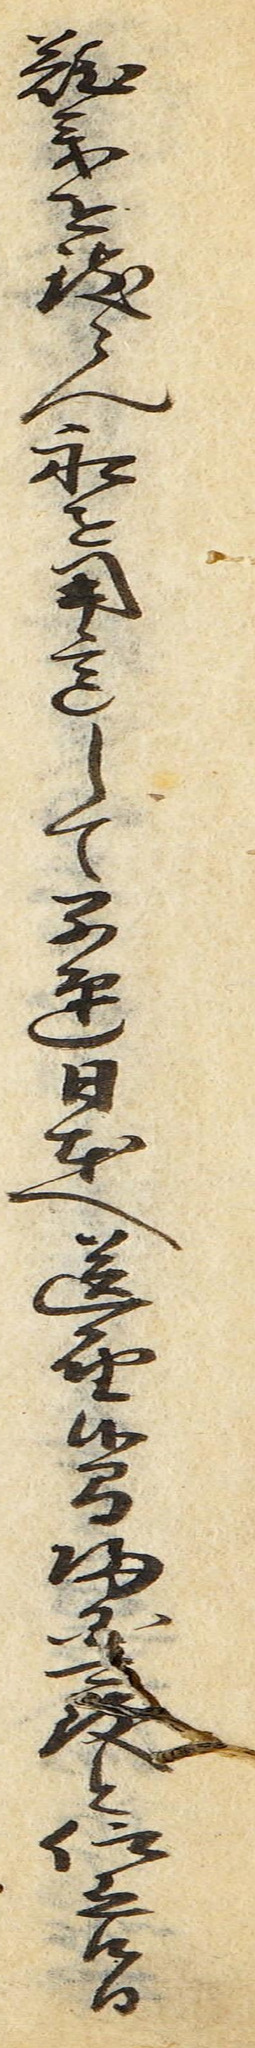難義を致らん船を用意して早速日本へ送届候間帰国可致と仰有ける
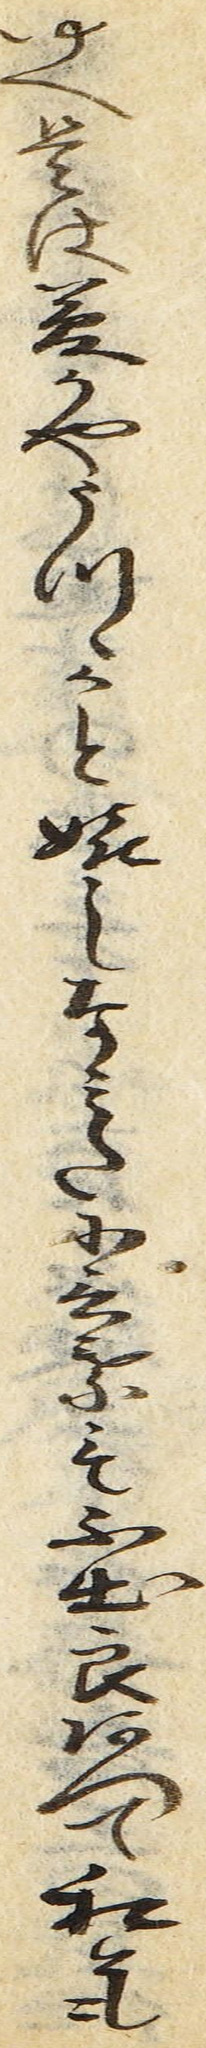ゆへ是は夢かやうつゝかと嬉しなみたに言葉も不出良あつて私とも
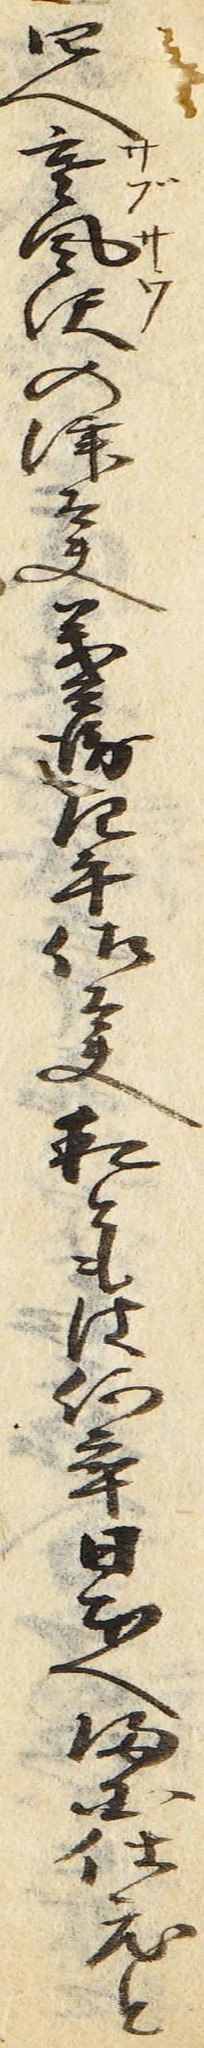四人寒風沢の津太夫義兵衛左平佐太夫私ともは何卒に日本へ帰仕度と
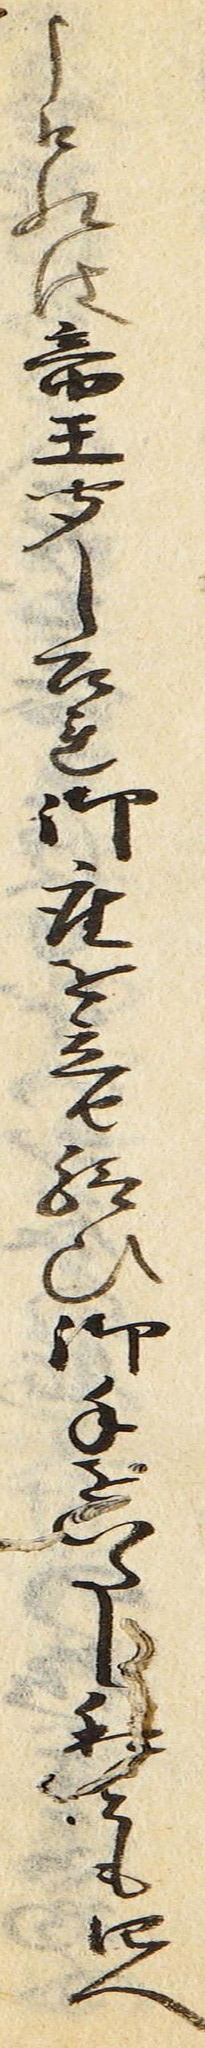申しけれは帝王聞し召れ御座を断つ立せ給ひ御手をいたし私とも四人
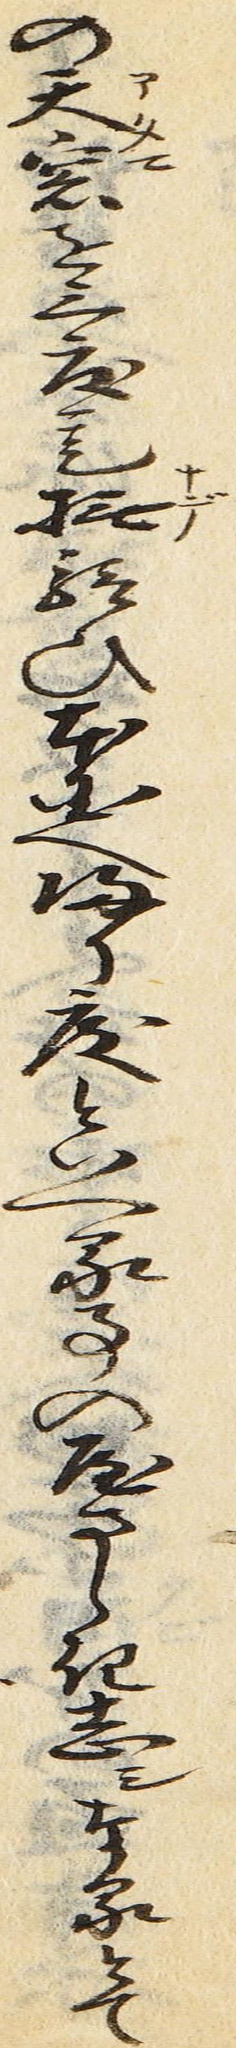の天窓を三度も撫給ひ本国へ帰り度といへる事のやさしき志しなるとて
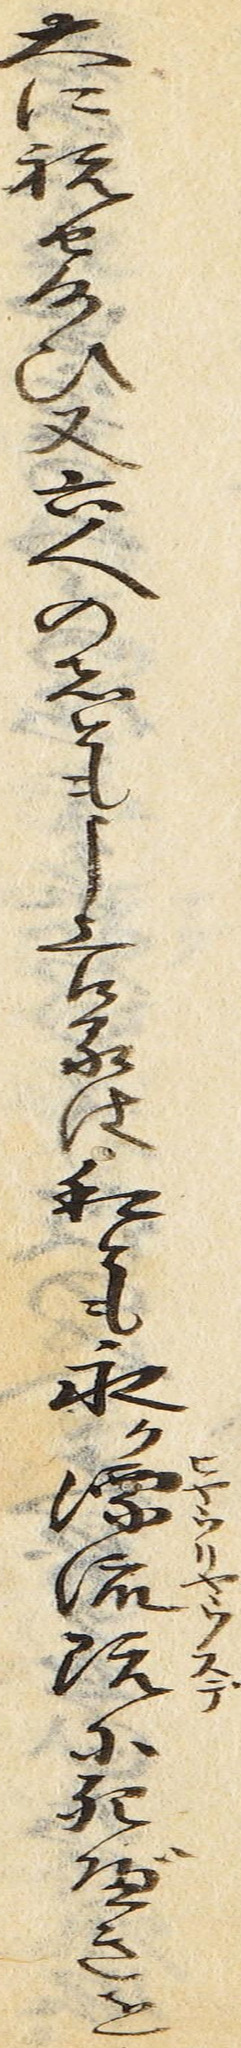大に祝せ給ひ又六人の者とも申し上けるは私とも永く漂流既に死べきを
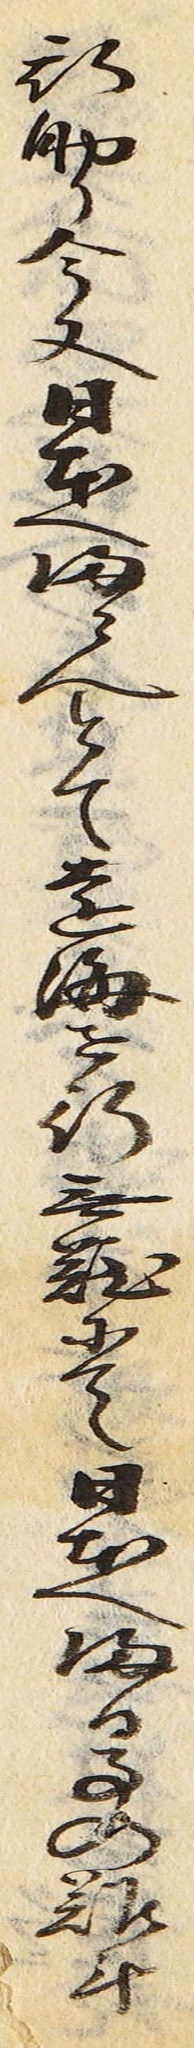斯助り今又日本へ帰らんとて遠海を行無難にて日本へ帰る事の難計
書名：外国漂流記
